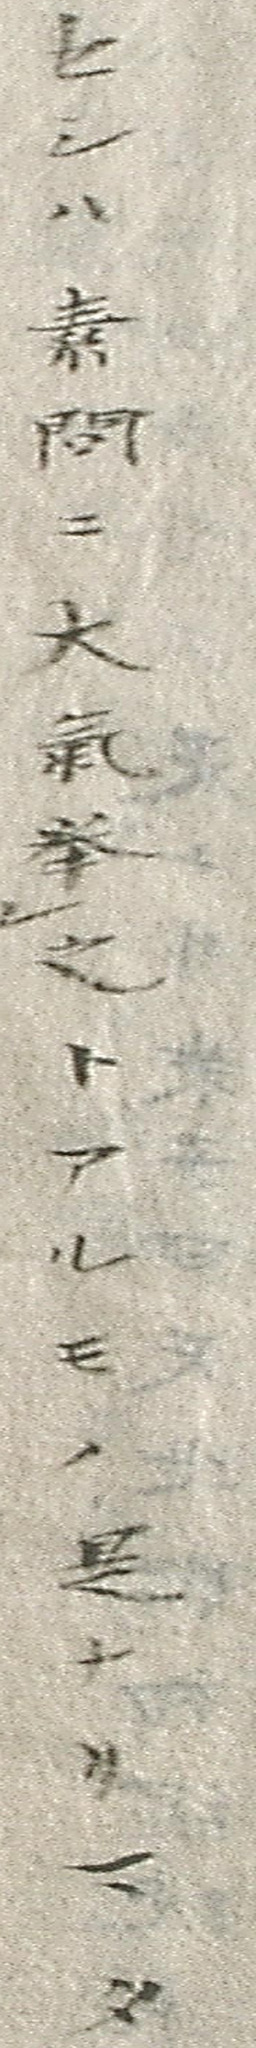セシハ素問ニ大気挙之トアルモノ是ナリマタ
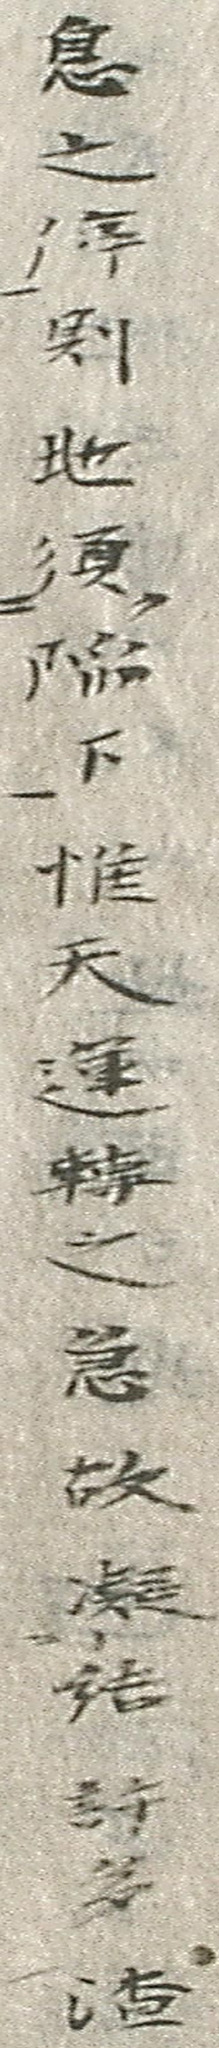息之渟則地須ニ陥下惟天運転之急故凝結許多渣
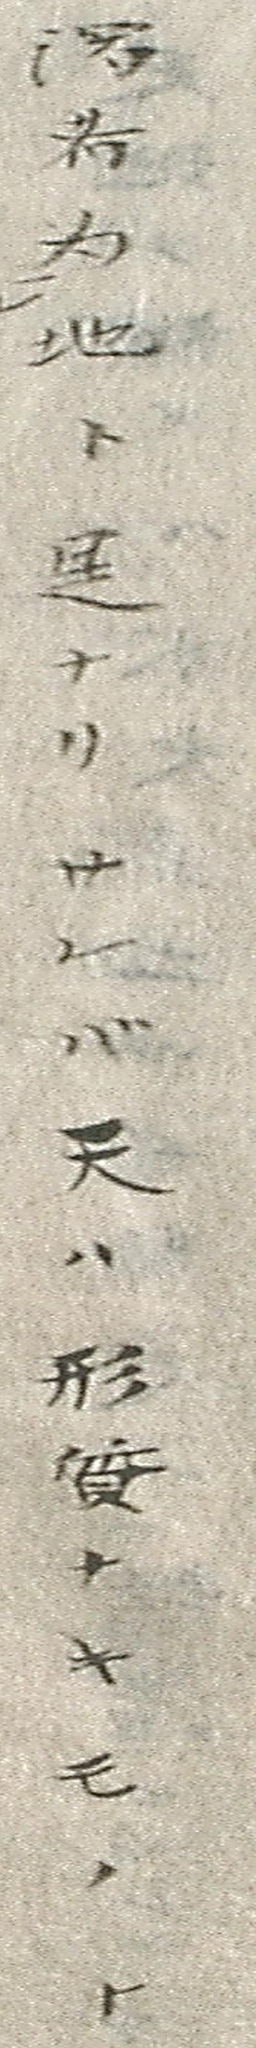濁者為地ト是ナリサレバ天ハ形質ナキモノナ
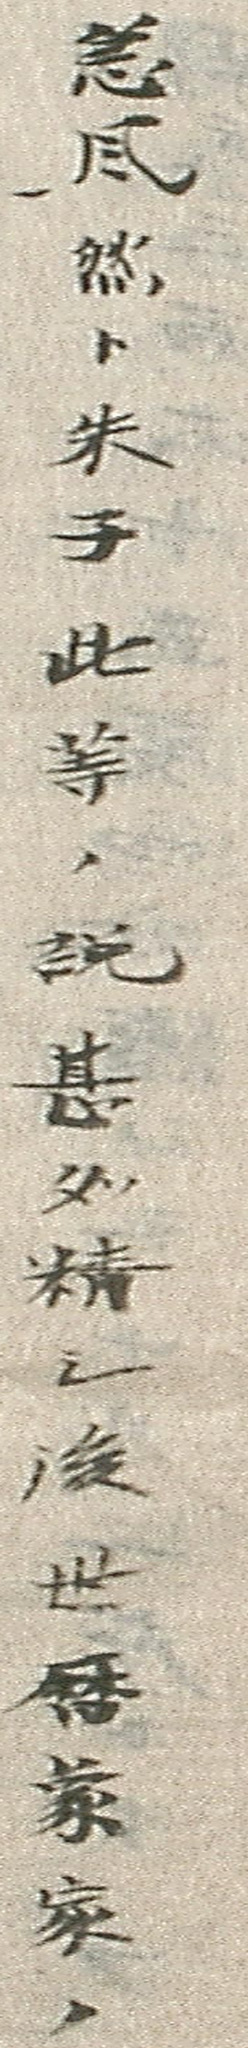急風然ト朱子此等ノ説甚ダ精シ後世暦蒙家ノ
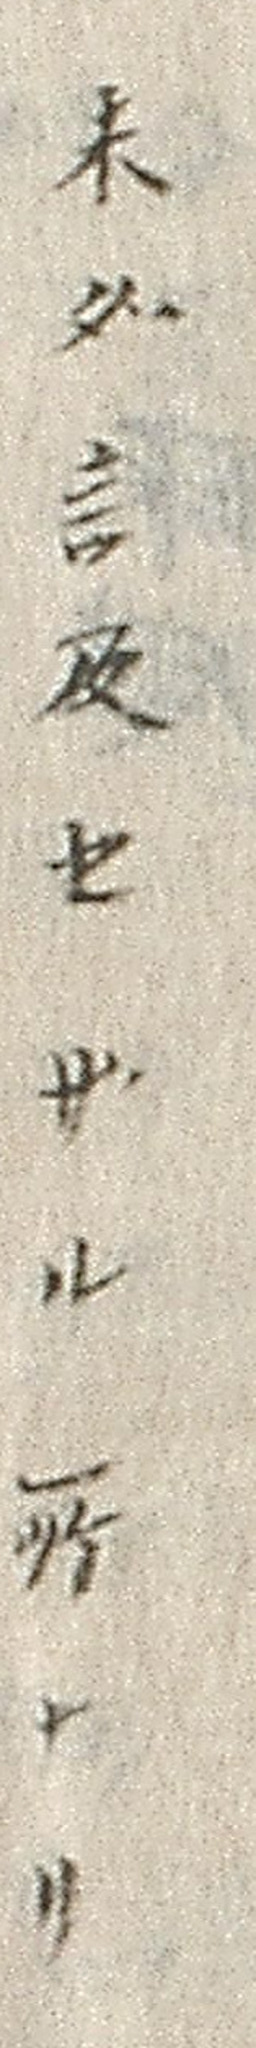未ダ言及セザル所ナリ
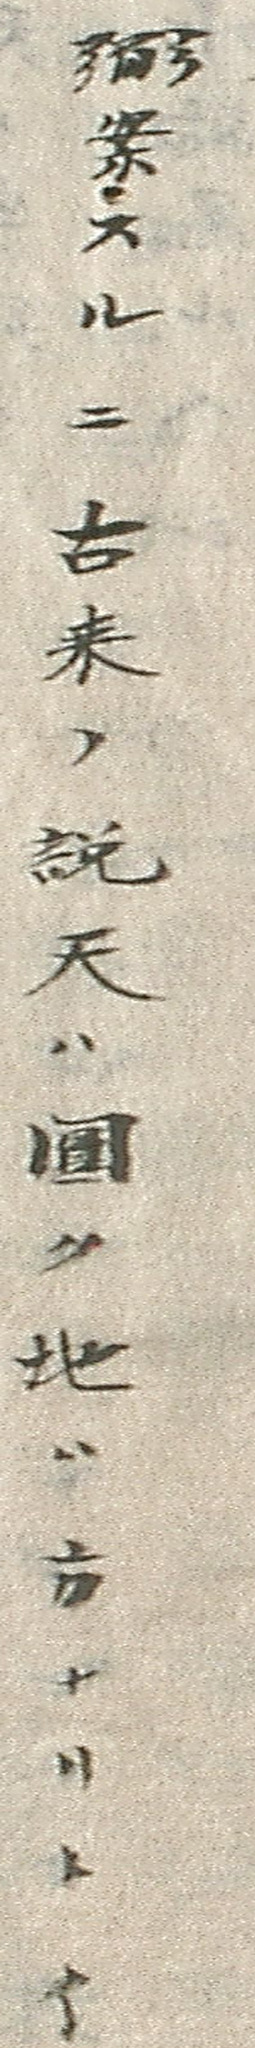弼案スルニ古来ノ説天ハ円ク地ハ方ナリトイ
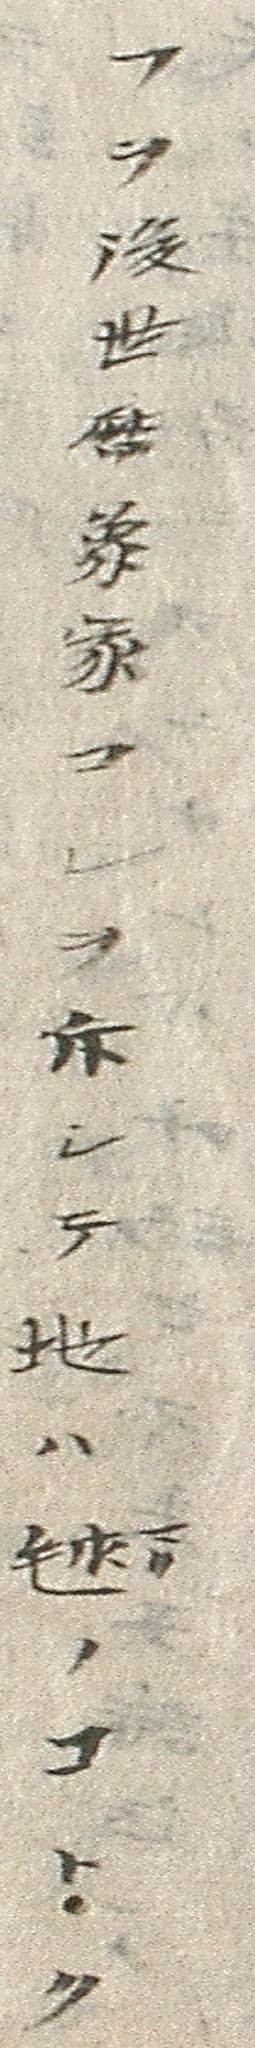フヲ後世暦蒙家コレヲ斥シテ地ハ毬ノコトク
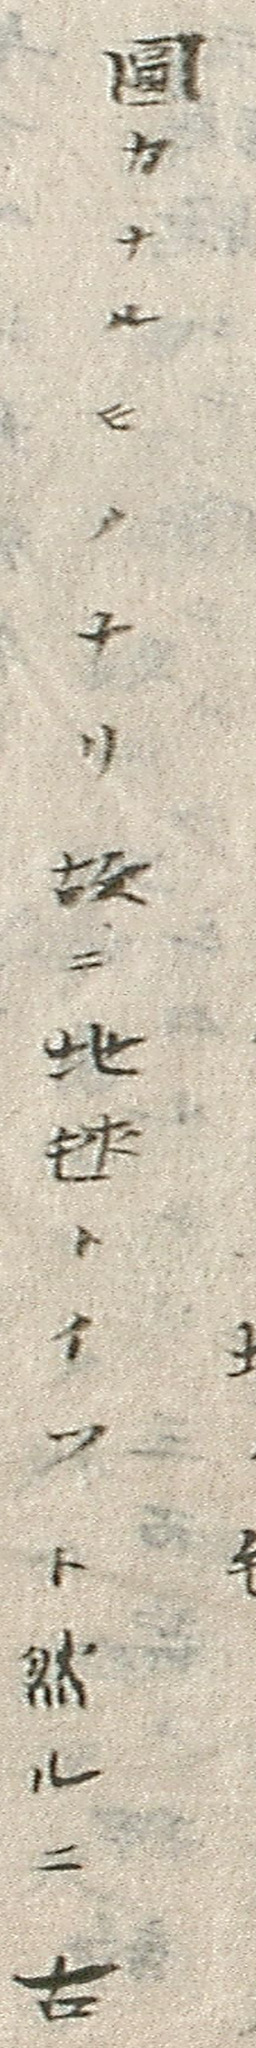円カナルモノナリ故ニ地毬トイフト然ルニ古
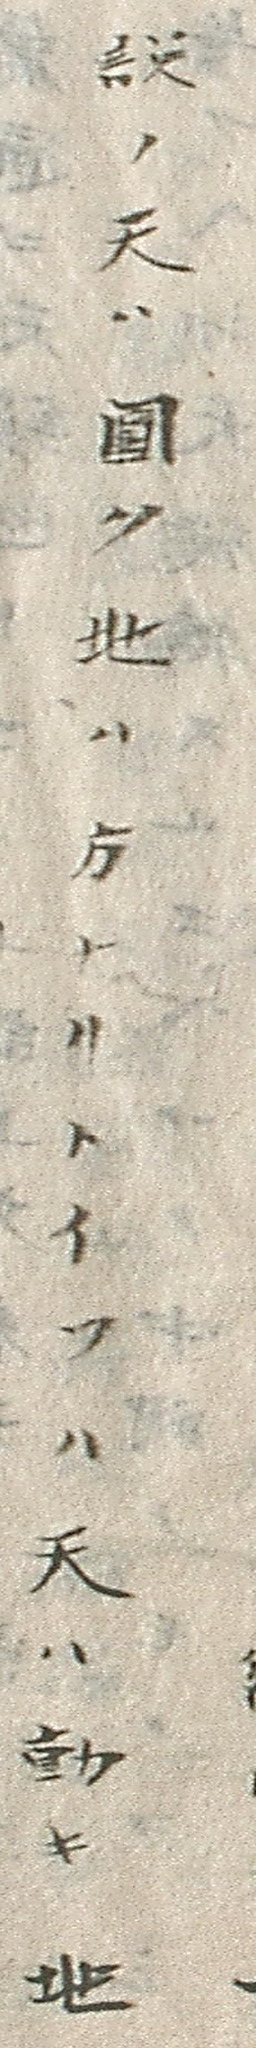説ノ天ハ円ク地ハ方ナリトイフハ天ハ動キ地
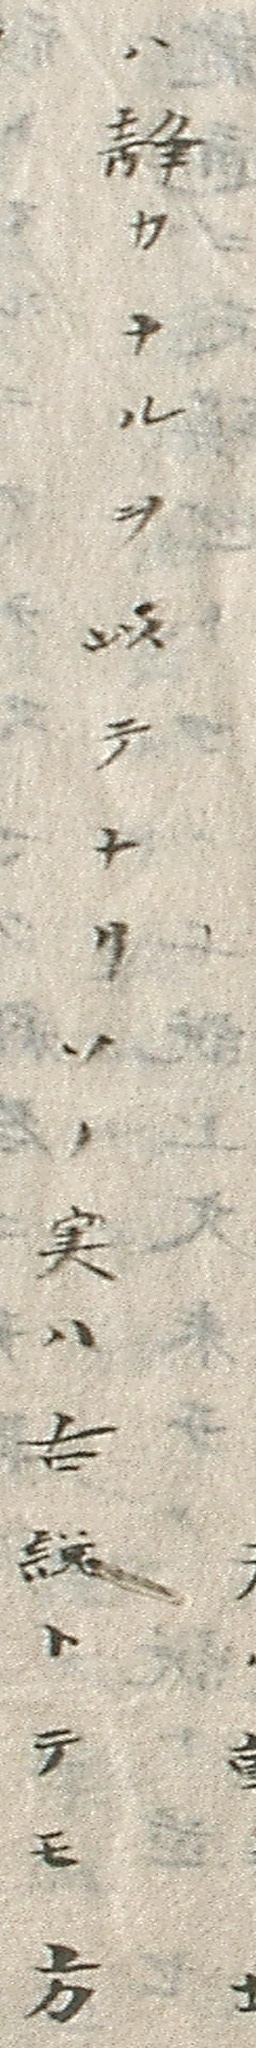ハ静カナルヲ以テナリソノ実ハ古説トテモ方
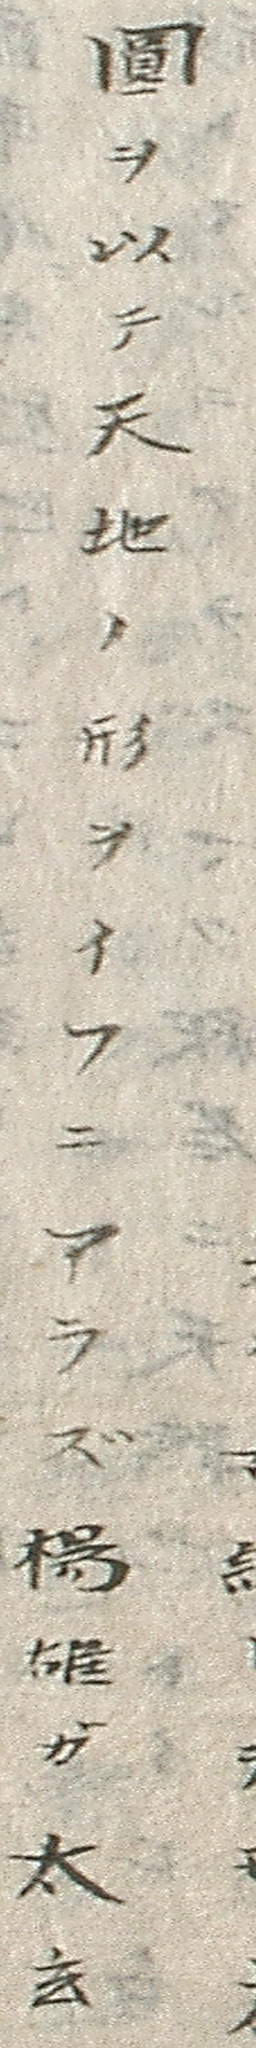円ヲ以テ天地ノ形ヲイフニアラズ楊雄ガ太玄
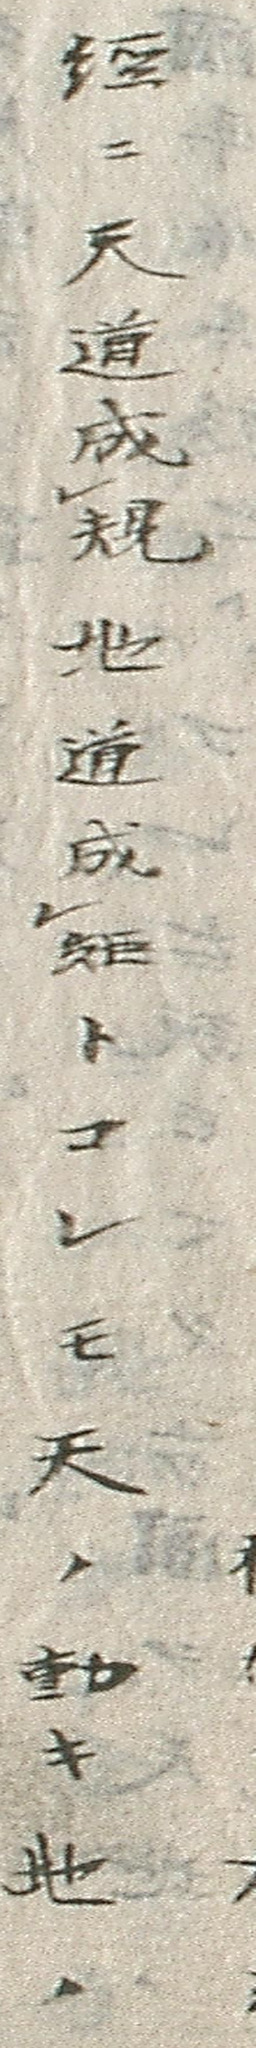経ニ天道成規地道成矩トコレモ天ノ動キ地ノ
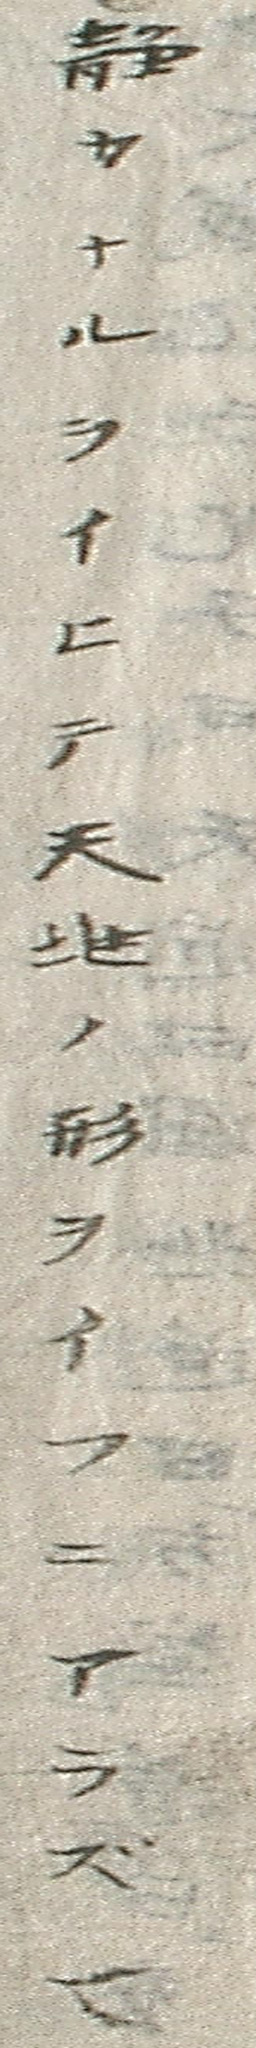静カナルヲイヒテ天地ノ形ヲイフニアラズ一

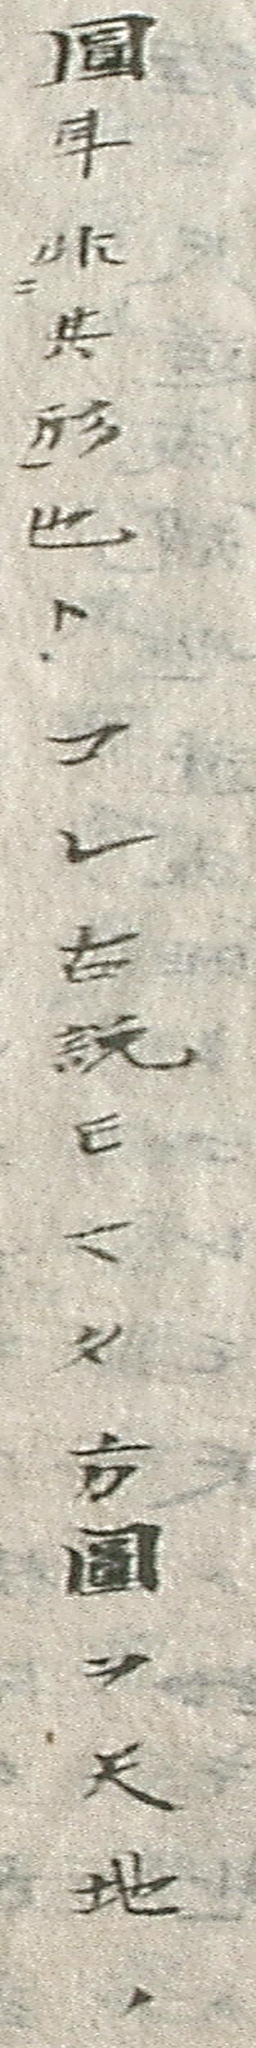円車状ニ其形也トコレ古説モマタ方円ヲ天地ノ
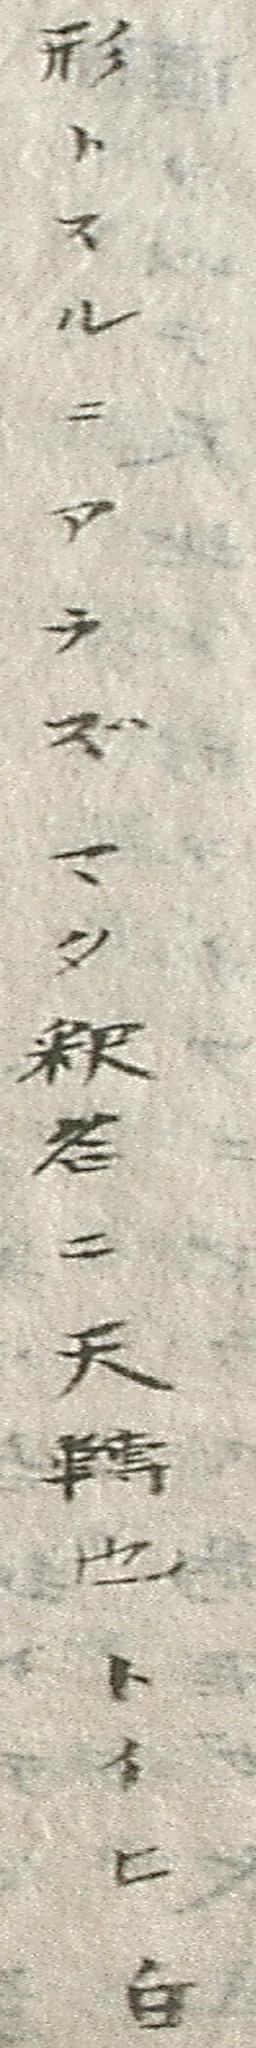形トスルニアラズマタ釈各ニ天転也トイヒ白
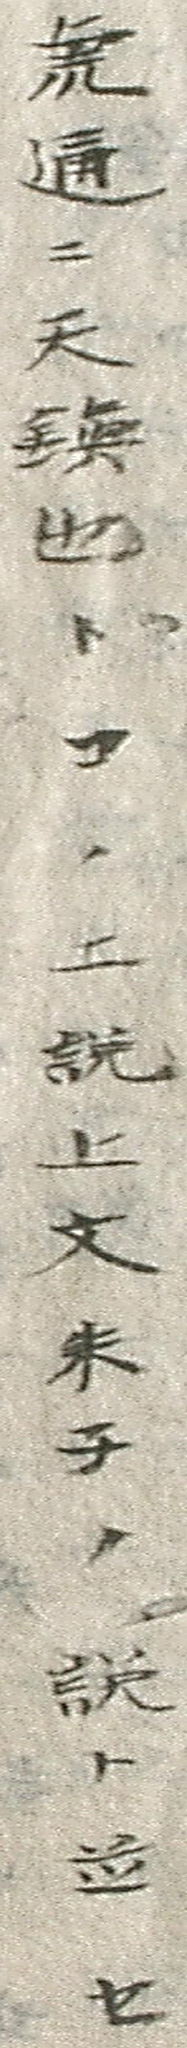虎通ニ天鎮也トコノニ説上文朱子ノ説ト並セ
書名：天學便蒙図説
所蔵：東京大学地震研究所図書室 Earthquake Research Institute Library, The University of Tokyo, JAPAN
